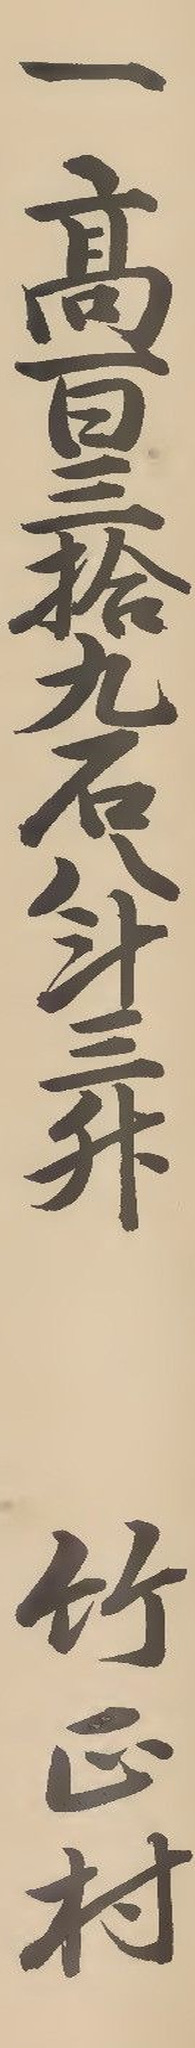一高百三拾九石八斗三升竹正村
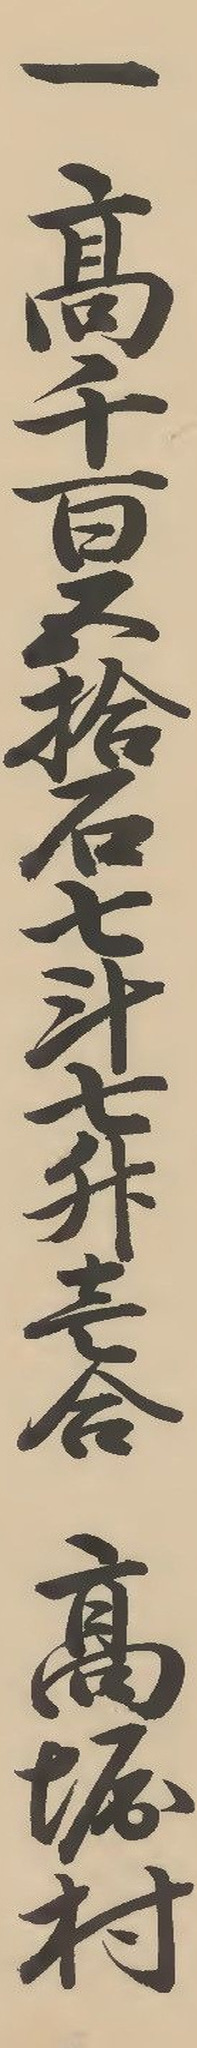一高千百五拾石七斗七升壱合高堀村
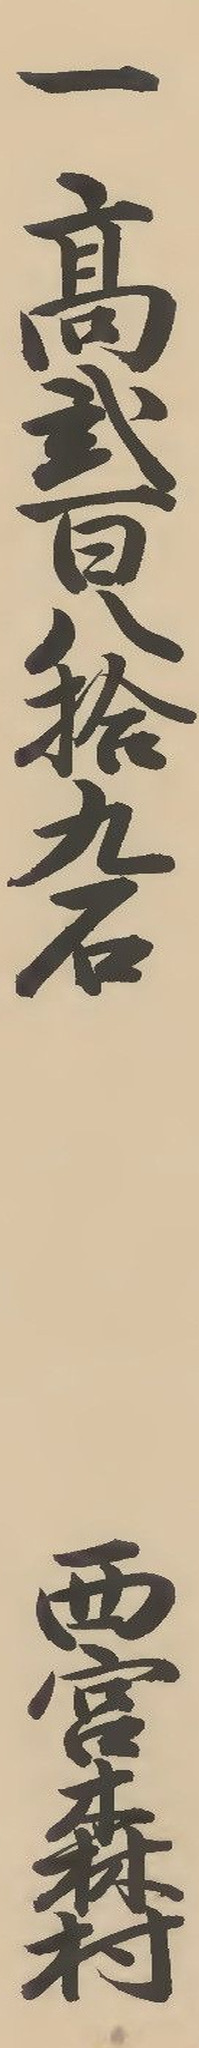一高弐百八拾九石西宮森村
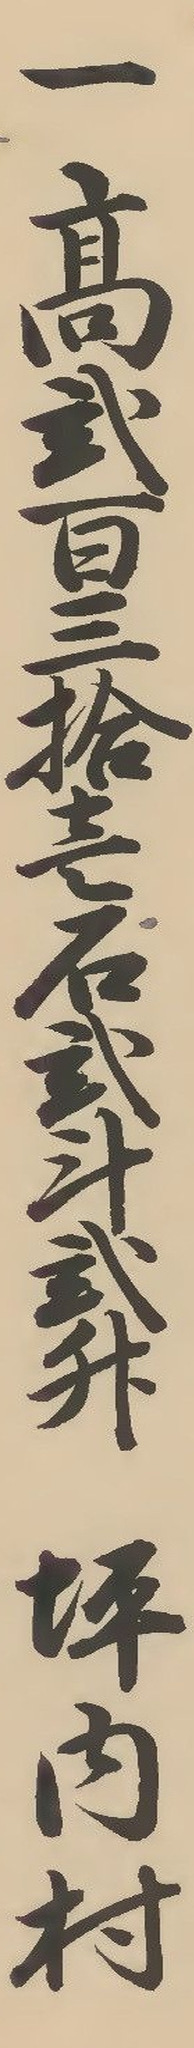一高弐百三拾壱石弐斗弐升坪内村

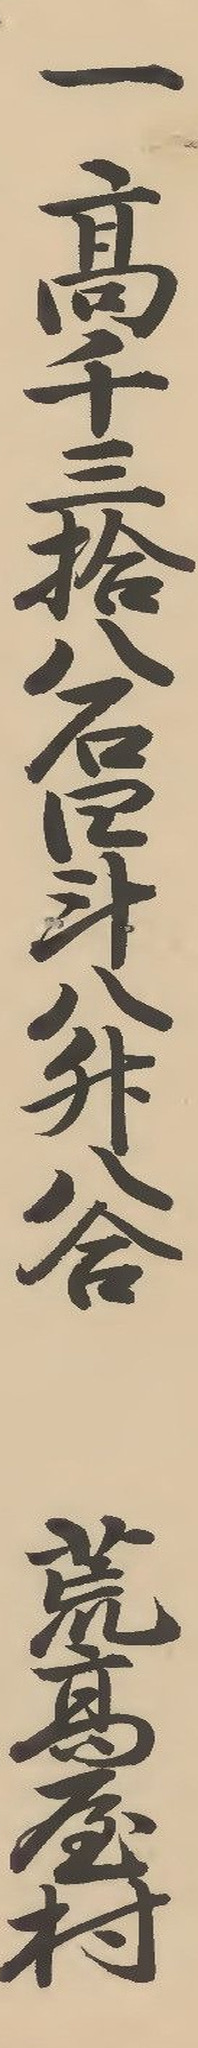一高千三拾八石四斗八升八合荒高屋村
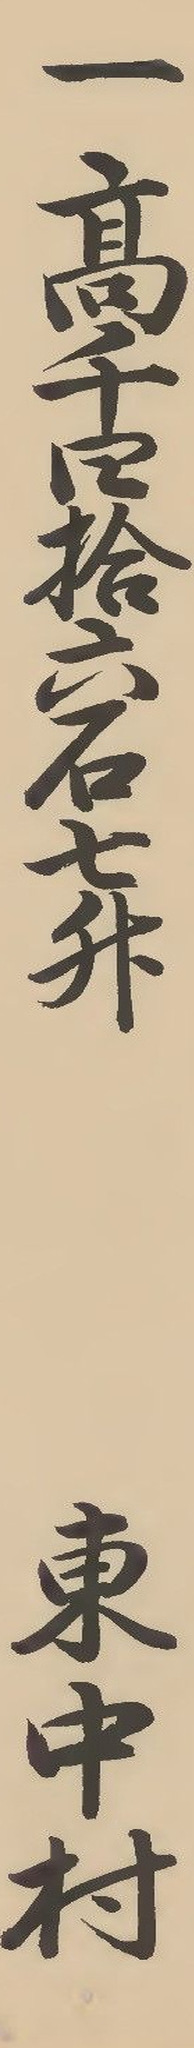一高千四拾六石七升東中村
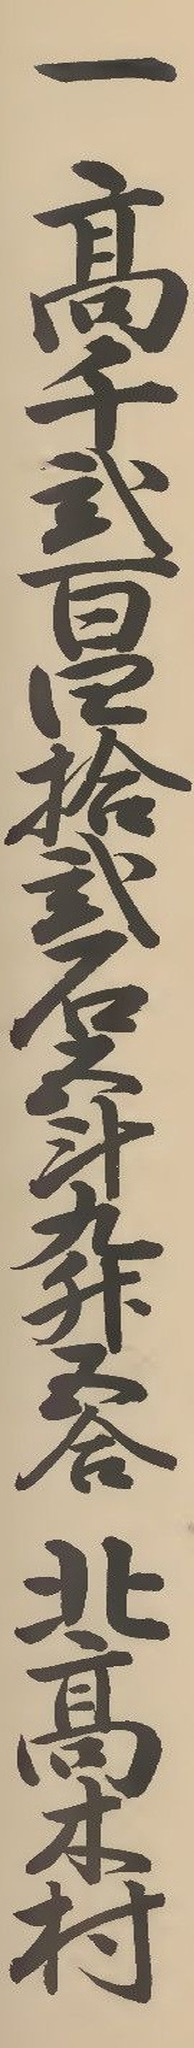一高千弐百四拾弐石五斗九升五合北高木村
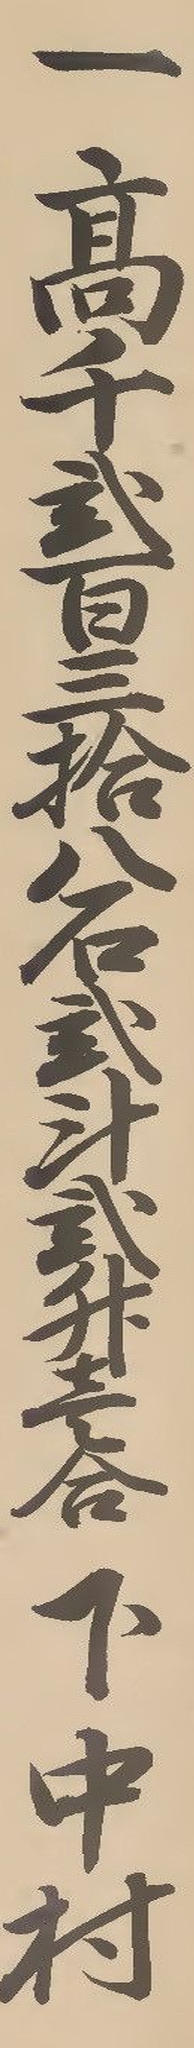一高千弐百三拾八石弐斗弐升壱合下中村
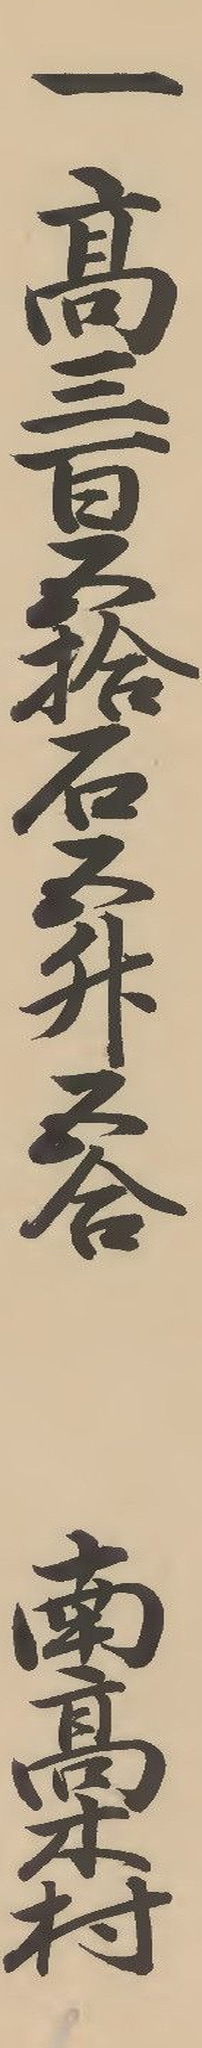一高三百五拾石五升五合南高木村
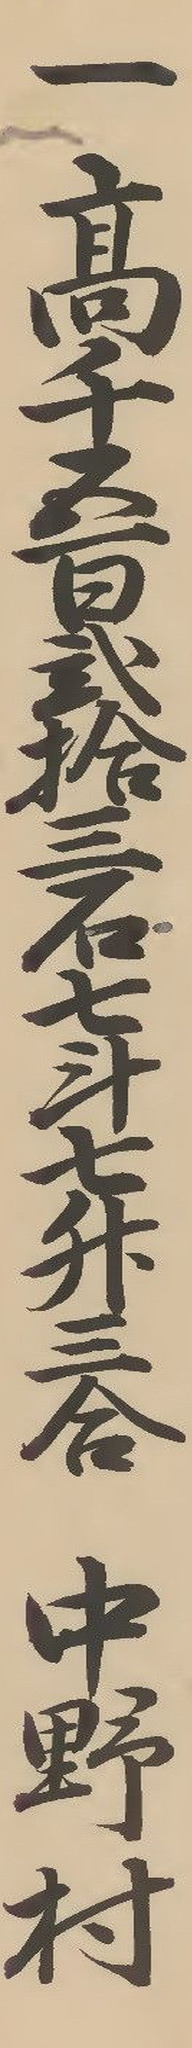一高千五百弐拾三石七斗七升三合中野村

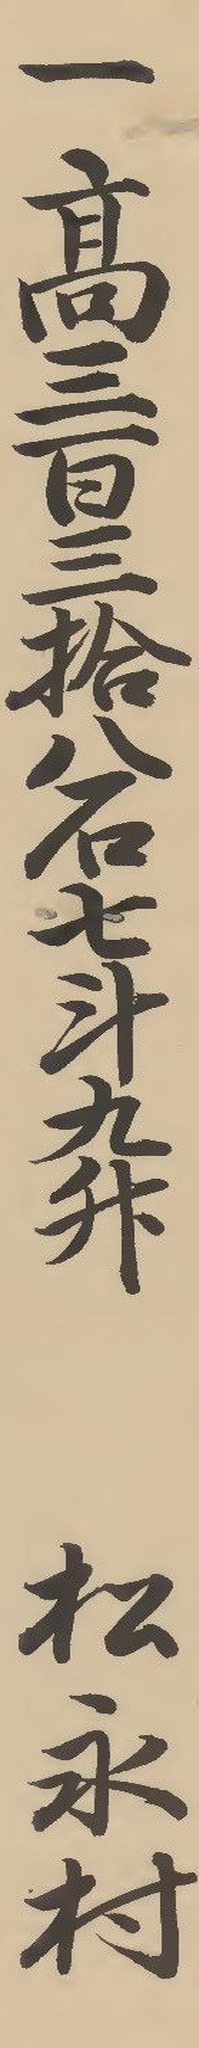一高三百三拾八石七斗九升松永村
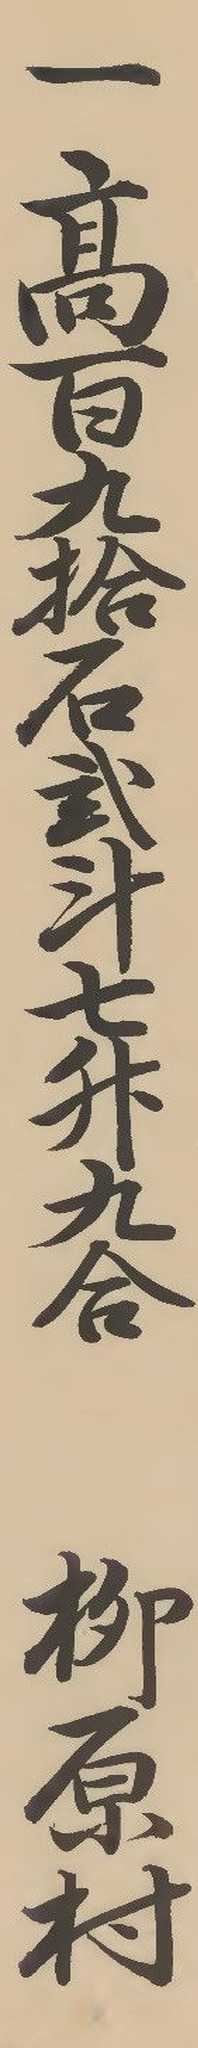一高百九拾石弐斗七升九合柳原村
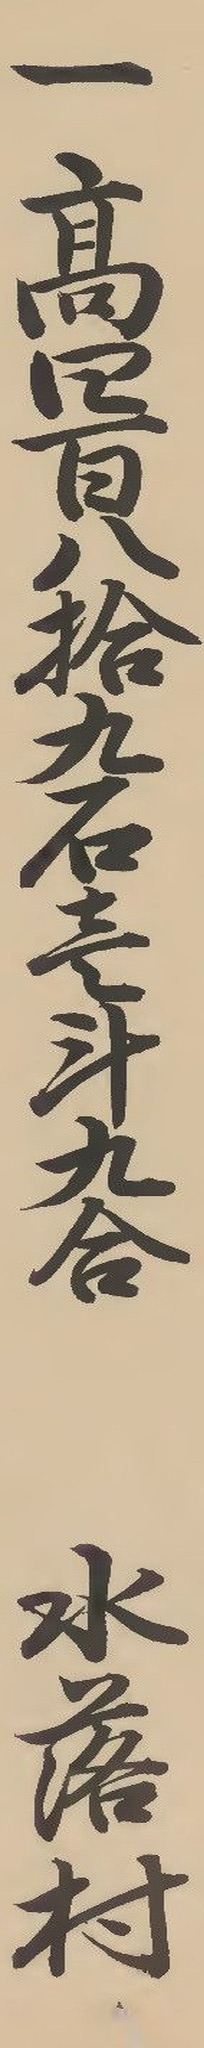一高四百八拾九石壱斗九合水落村
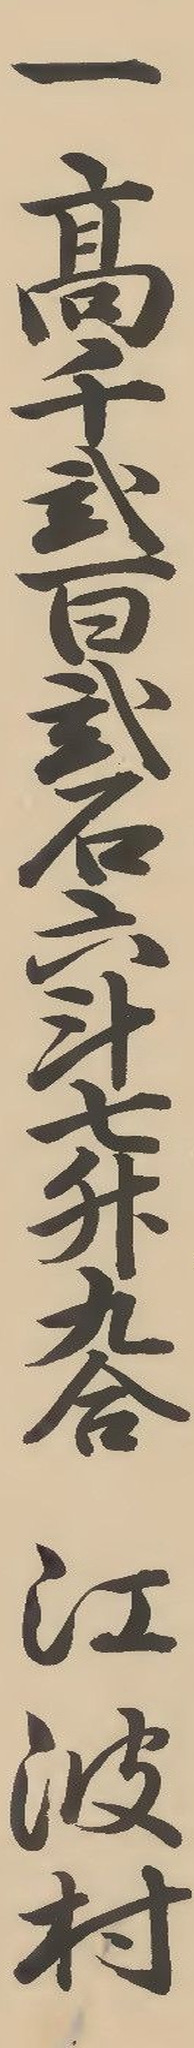一高千弐百弐石六斗七升九合江波村

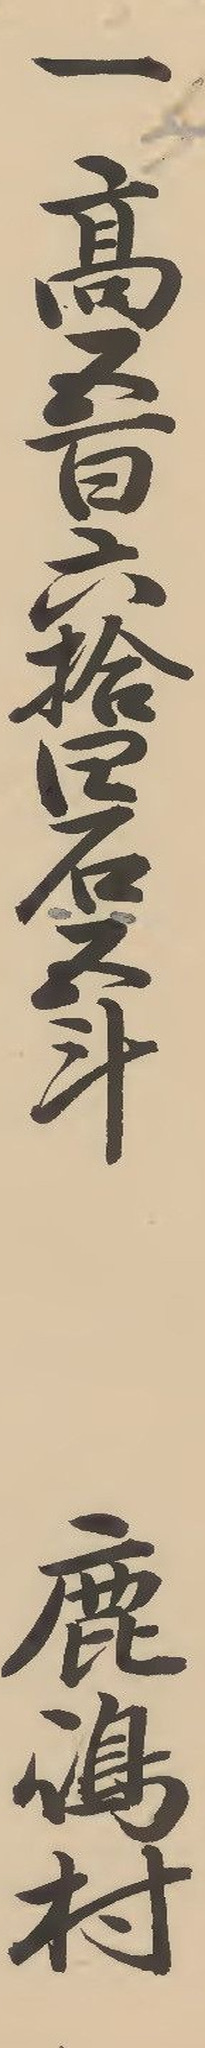一高五百六拾四石五斗鹿島村
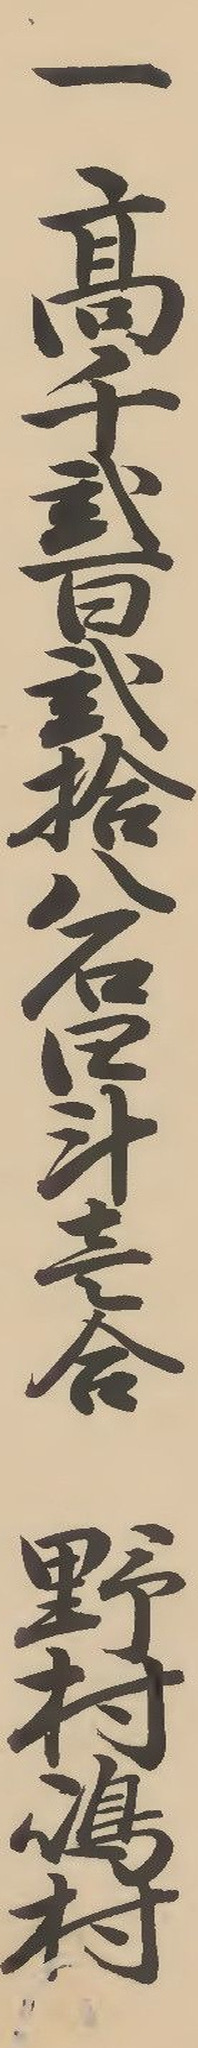一高千弐百弐拾八石四斗壱合野村島村
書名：越中国郷帳
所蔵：国立公文書館 National Archives of Japan
